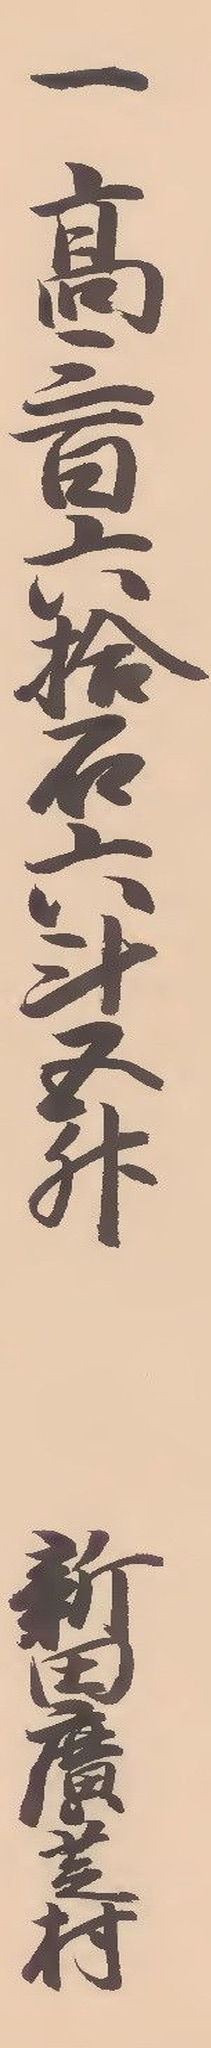一高三百六拾石六斗五升新田広芝村
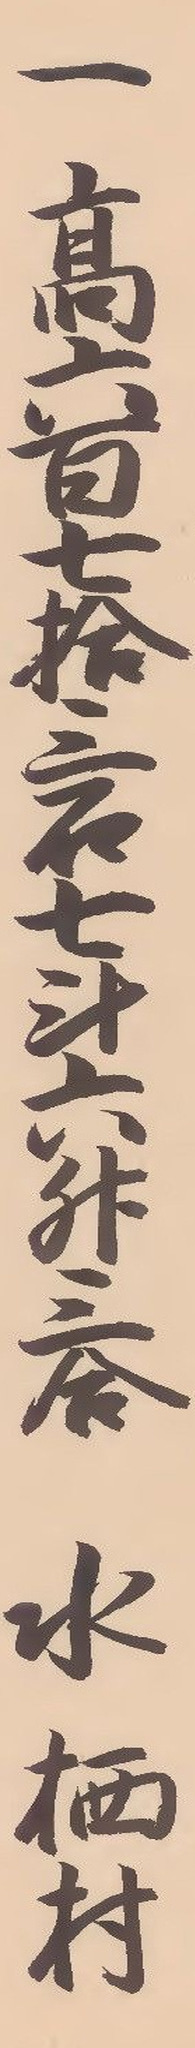一高六百七拾三石七斗六升三合水栖村
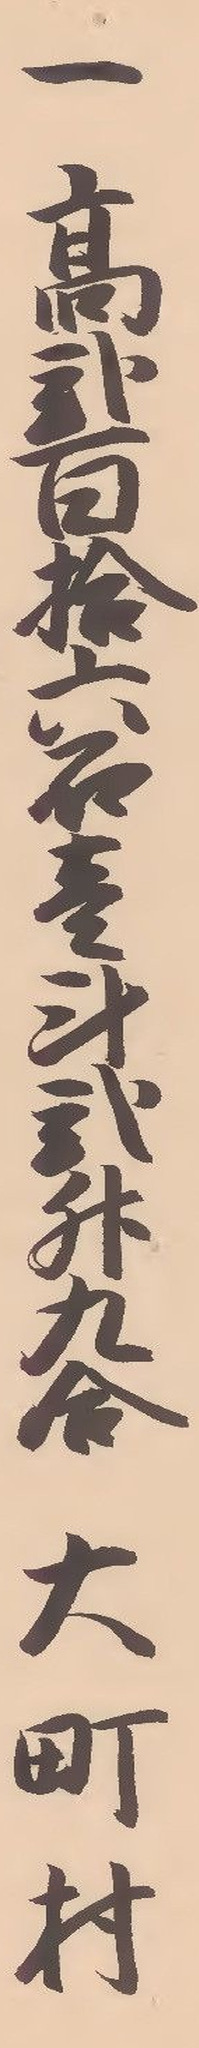一高弐百拾六石壱斗弐升九合大町村
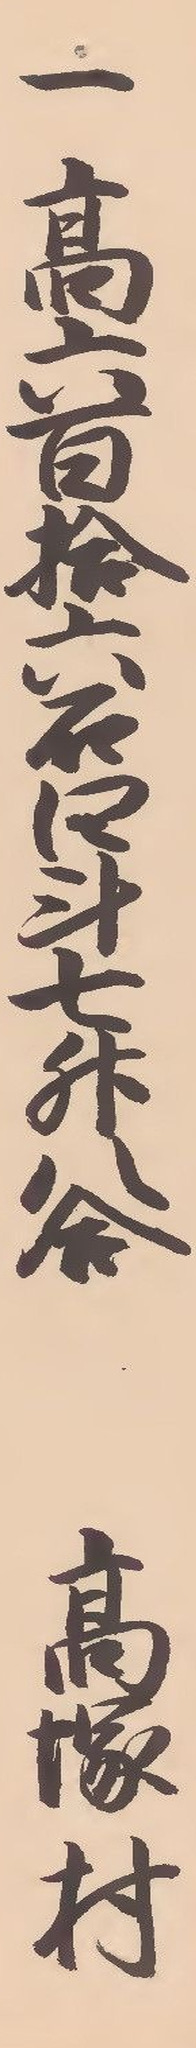一高六百拾六石四斗七升八合高塚村
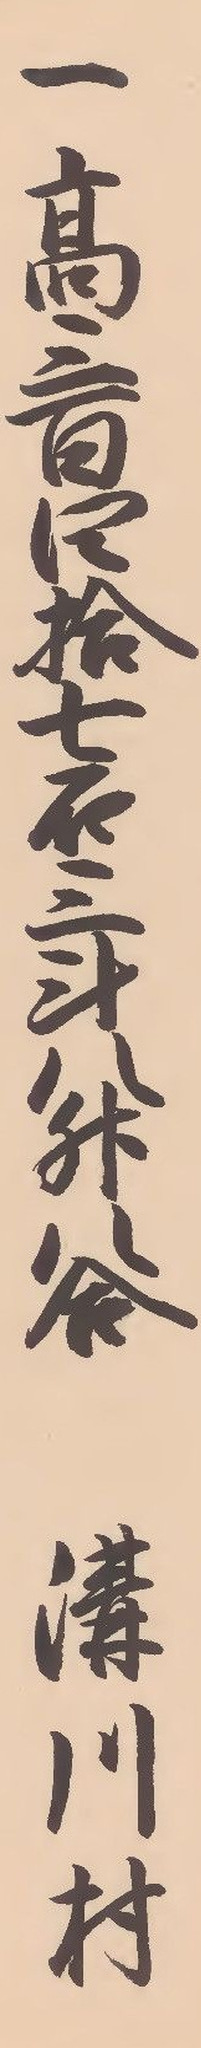一高三百四拾七石三斗八升八合溝川村
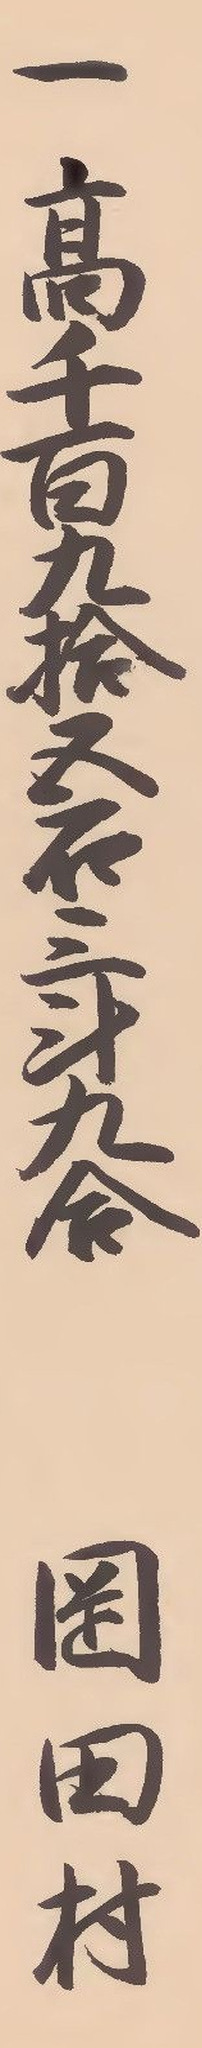一高千百九拾五石三斗九合岡田村
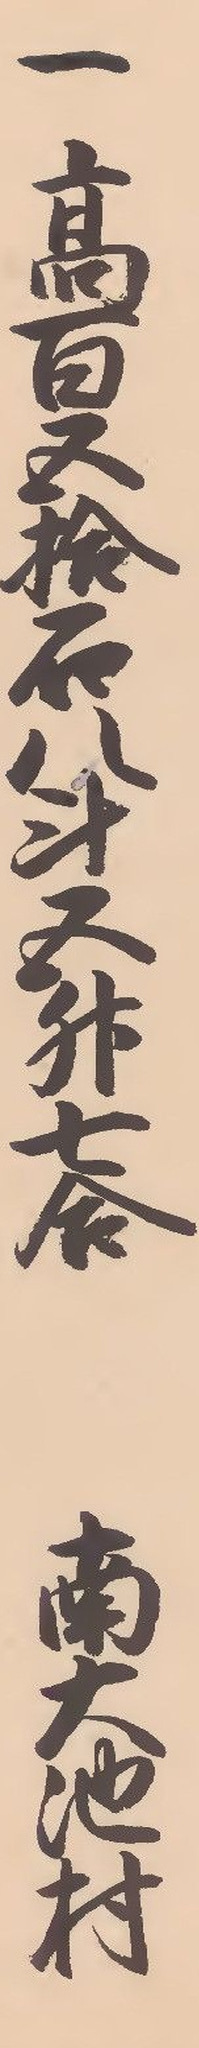一高百五拾石八斗五升七合南大池村

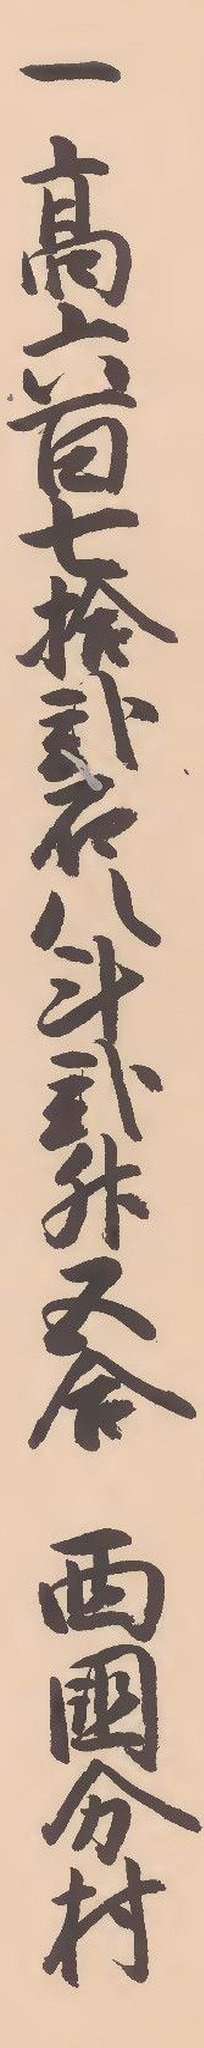一高六百七拾弐石八斗弐升五合西国分村
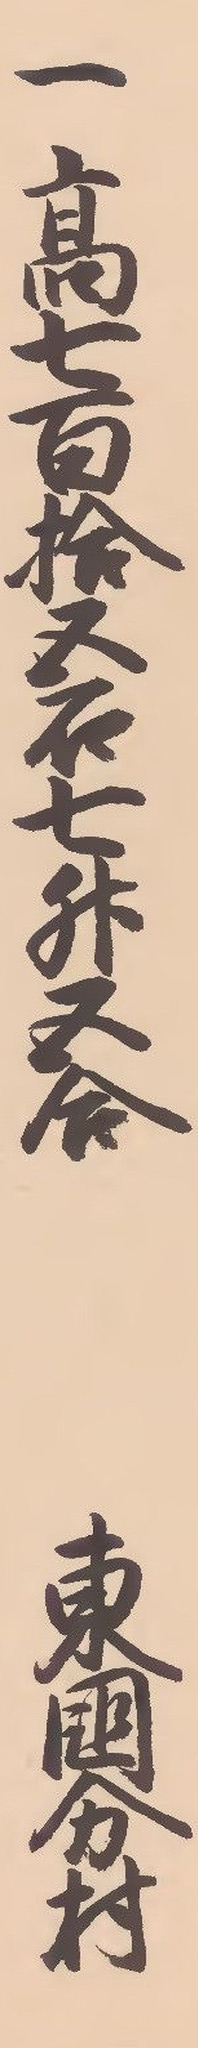一高七百拾五石七升五合東国分村
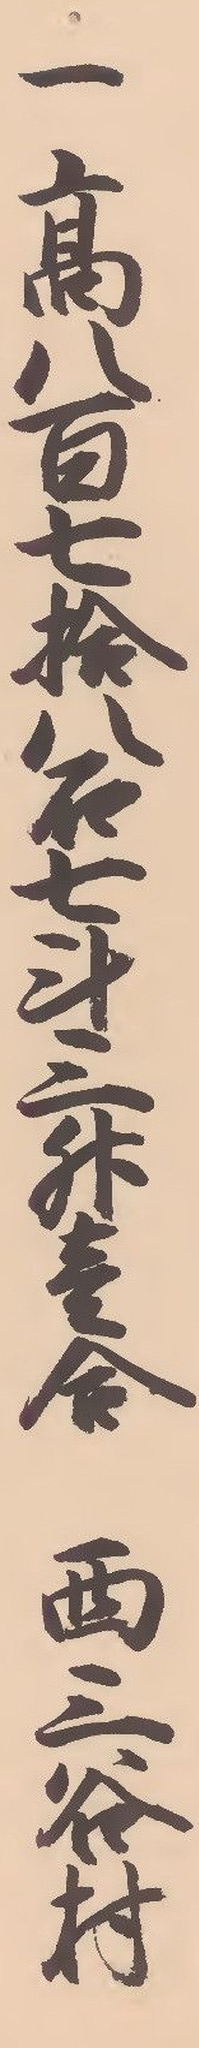一高八百七拾八石七斗三升壱合西三谷村
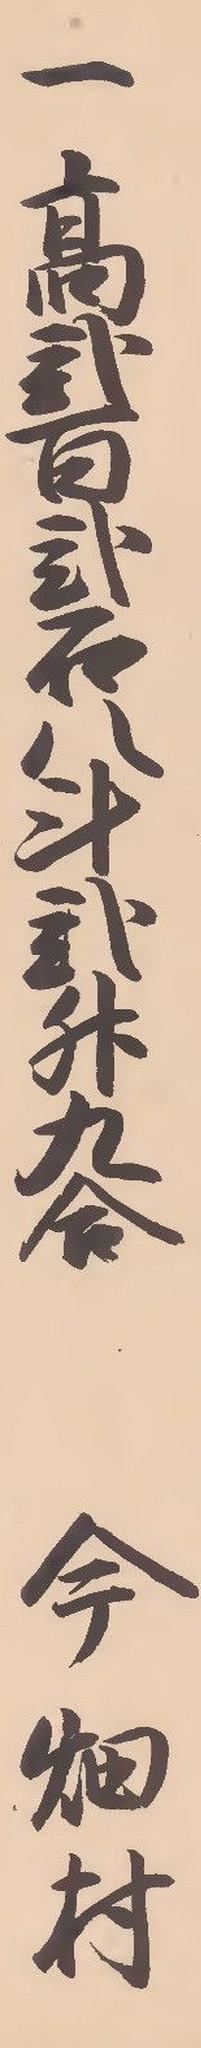一高弐百弐石八斗弐升九合今畑村
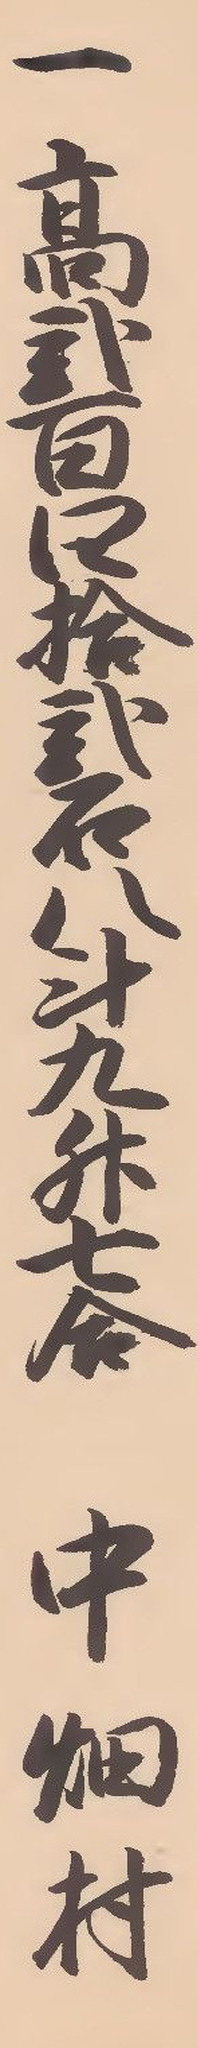一高弐百四拾弐石八斗九升七合中畑村
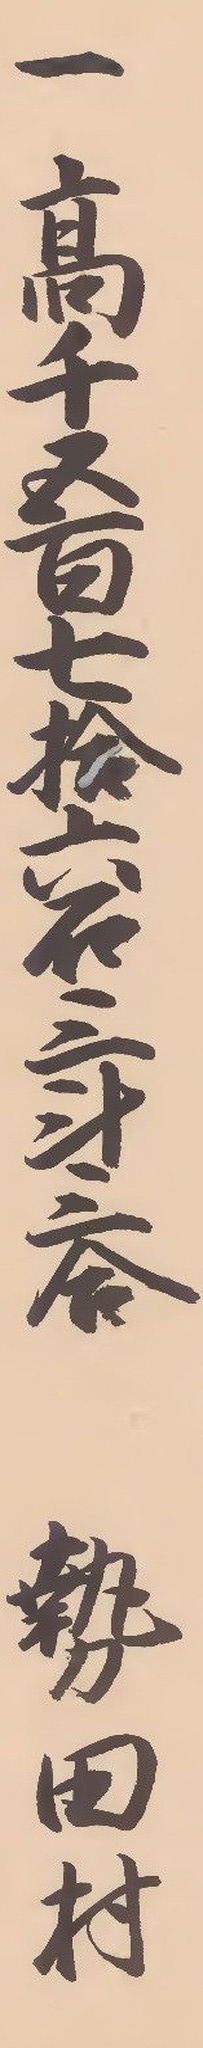一高千五百七拾六石三斗三合勢田村

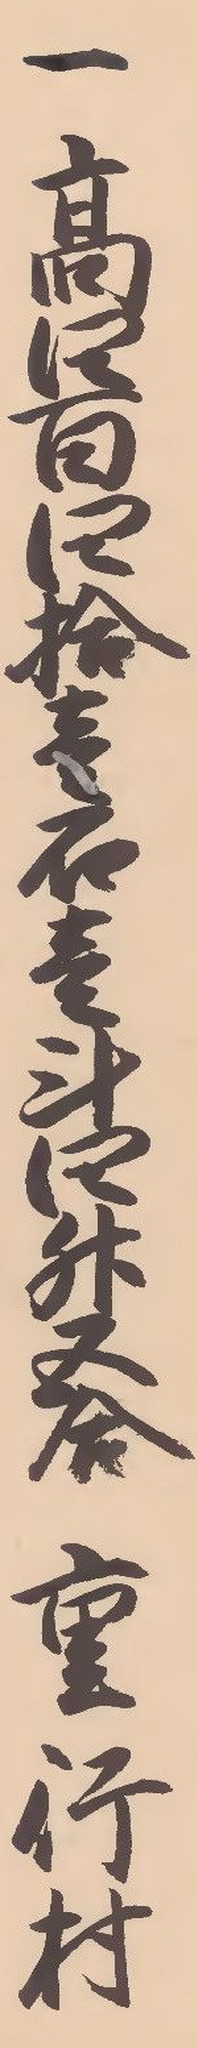一高四百四拾壱石壱斗四升五合重行村
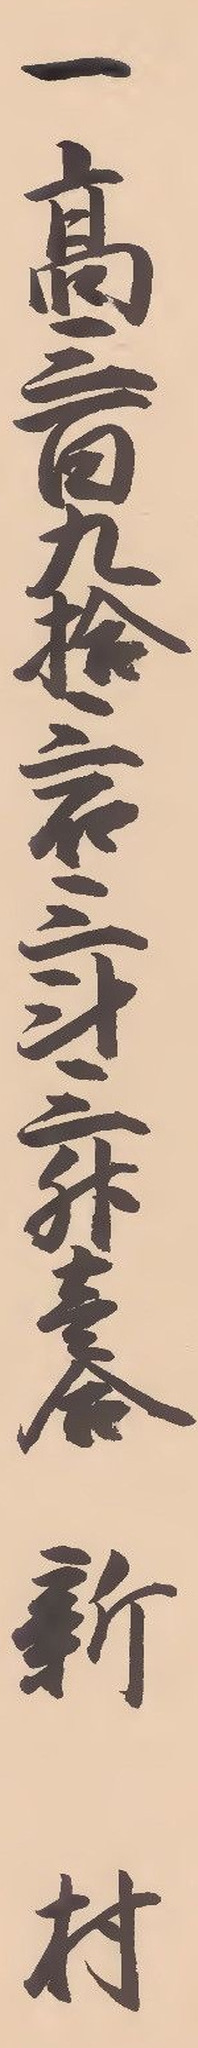一高三百九拾三石三斗三升壱合新村
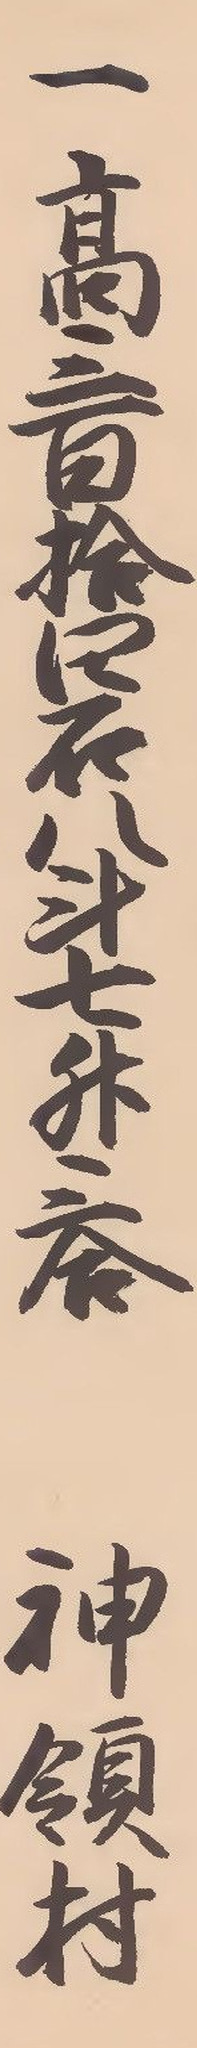一高三百拾四石八斗七升三合神領村
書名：紀伊国郷帳
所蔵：国立公文書館 National Archives of Japan
